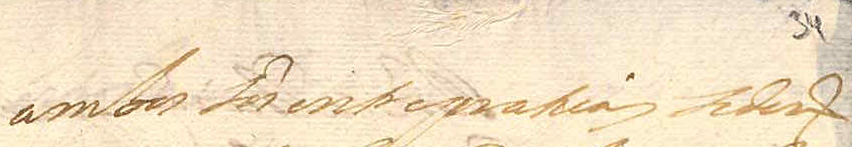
ambos sós entre praticas se deraõ
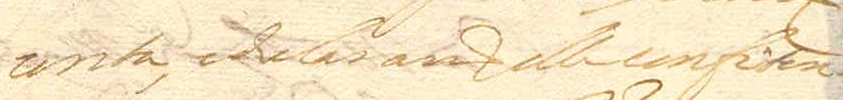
conta, e declararaõ elle confiten
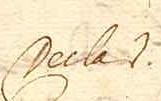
Declar.
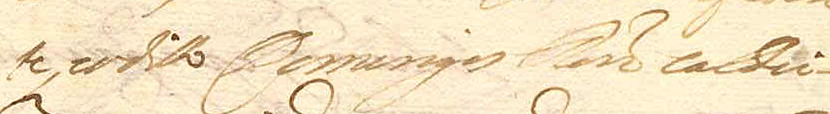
te, e o dito Domingos Roiz̄ caldei
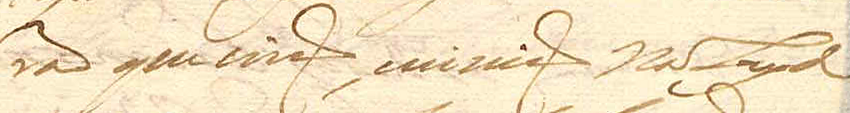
raõ que criaõ, e uiuiaõ na Ley de
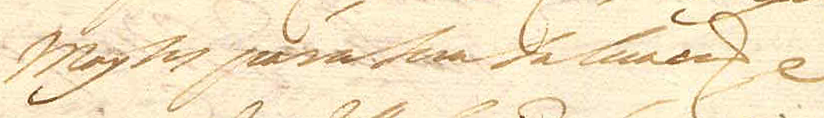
Moyzes para sua saluaçaõ, e
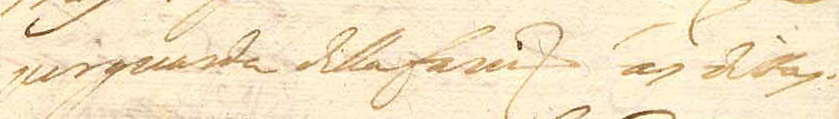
por guarda della faziaõ as ditas
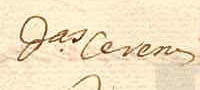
d.as cerem
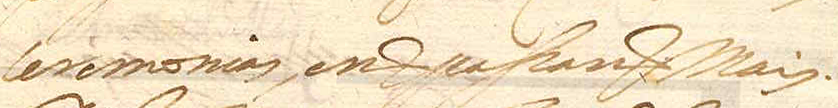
ceremonias, e nã passaraõ Mais.
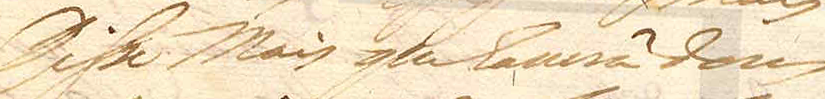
Disse Mais que hauerá dous
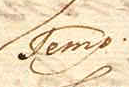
Temp.
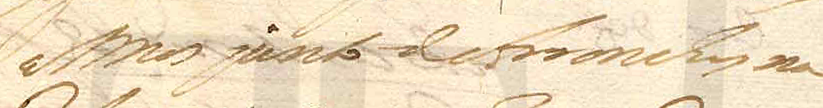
annos junto de Arronches na
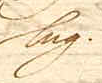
Lug.
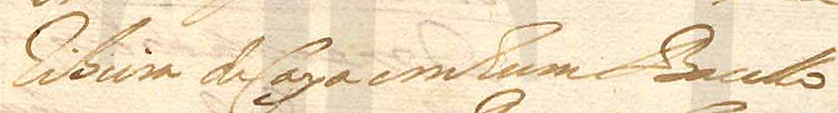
Ribeira de Caya em hum Bacello
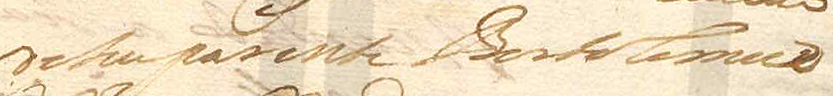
de seu parente Bertolemeu
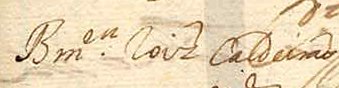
Bm.eu Roiz̄ Caldeiraõ
